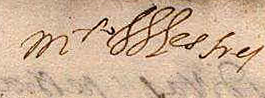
mto Illes sres
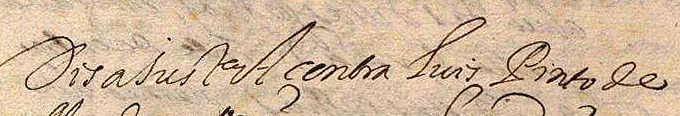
Dis a Iusta A contra Luis Pinto de
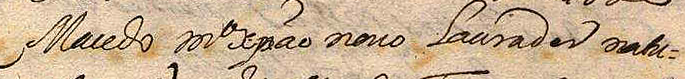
Macedo mo xpaõ nouo Laurador natu
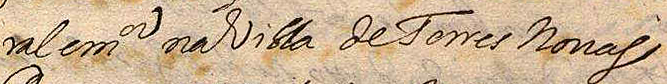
ral e mor na Villa de Torres nouas
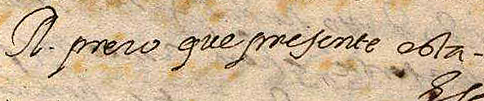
R. prezo que presente esta
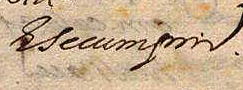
E se cumprir.
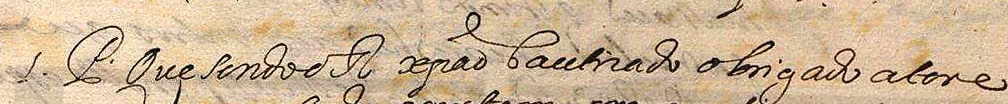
1. P. Que sendo o R xpaõ bautizado obrigado a ter e
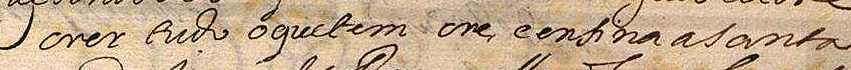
crer tudo o que tem cre, e ensina a santa
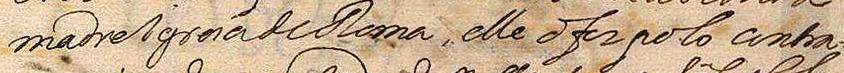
madre Igreia de Roma, elle o fez polo contra
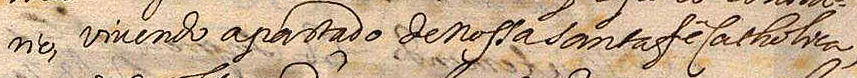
rio, viuendo apartado de nossa santa fé Catholica
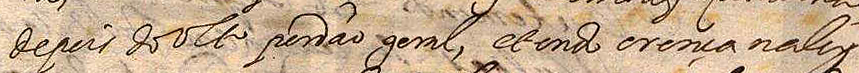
depois do vlto perdaõ geral, e tendo crença na ley
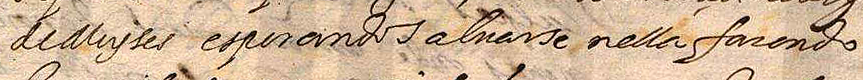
de Moyses, esperando saluarse nella fazendo
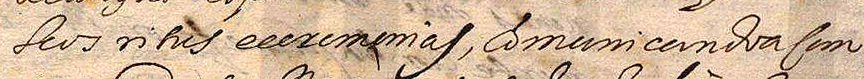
seos ritus e ceremonias, cōmunicandoa Com
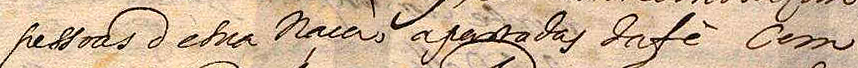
pessoas de sua naçaõ apartadas da fé com
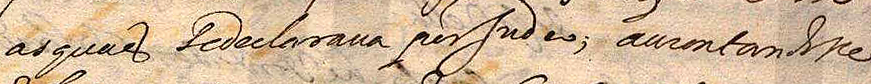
as quaes se declaraua por Judeo; auzentandosse
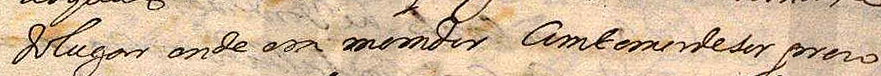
do lugar onde era morador com temor de ser prezo
